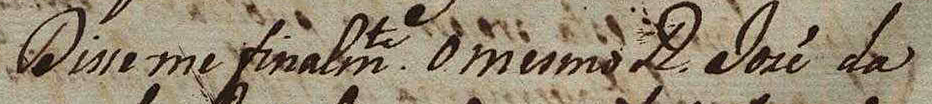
Disse me finalm.te o mesmo R. Iozé da
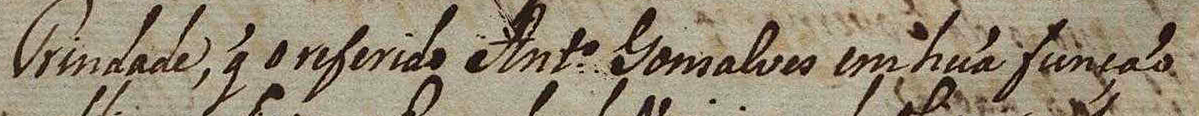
Trindade, q̄ o referido Ant.o Gonsalves em huā funçaõ
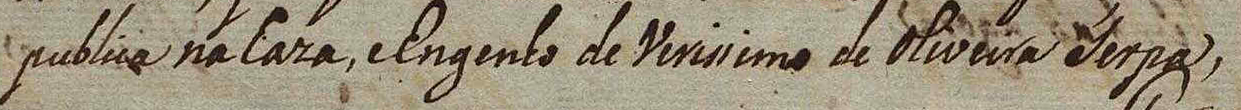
publica na Caza, e Engenho de Veressimo de Oliveira Serpa,
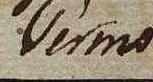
Termo
